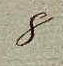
8
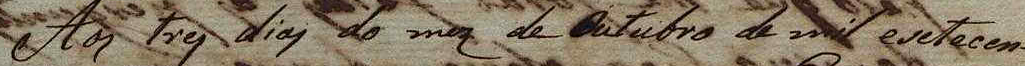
Aos tres dias do mez de Outubro de mil e setecen
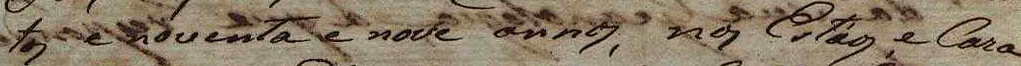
tos e noventa e nove annos, nos Estáos e Caza
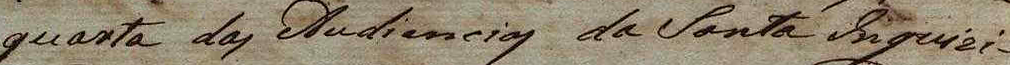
quarta das Audiencias da Santa Inquizi
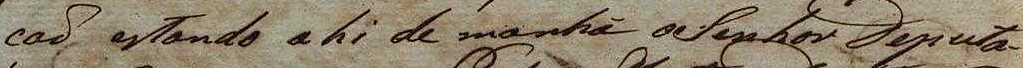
çaõ estando ahi de manhã o Senhor Deputa
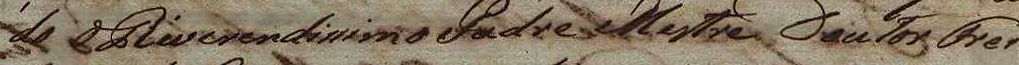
do o Reverendissimo Padre Mestre Doutor Frei
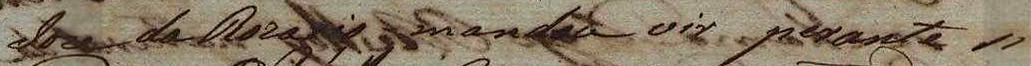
Ioze do Rozario mandou vir perante si
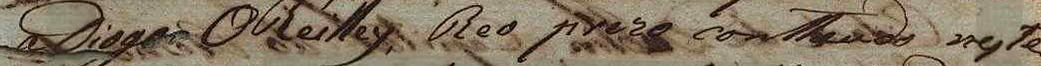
a Diogo OReiley, Reo prezo contheudo neste
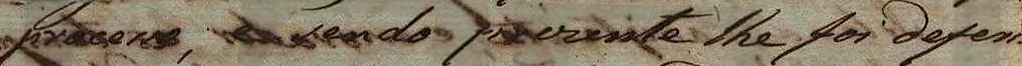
processo, e sendo prezente lhe foi deferi
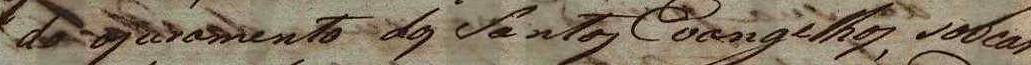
do o juramento dos Santos Evangelhos, sobcar
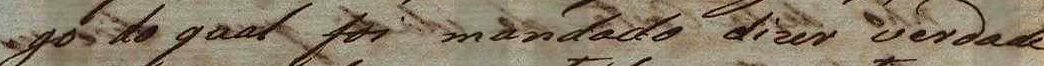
go do qual foi mandado dizer verdade
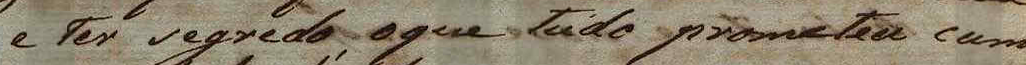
e ter segredo, o que tudo prometeu cum
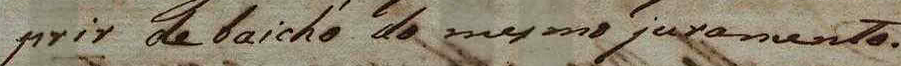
prir debaicho do mesmo juramento.
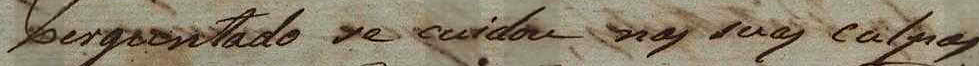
Perguntado se cuidou nas suas culpas
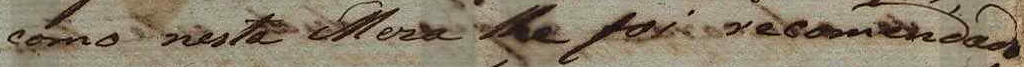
como nesta Meza lhe foi recomendado,
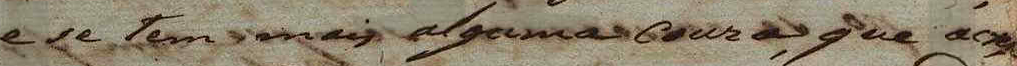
e se tem mais alguma couza, que acre
